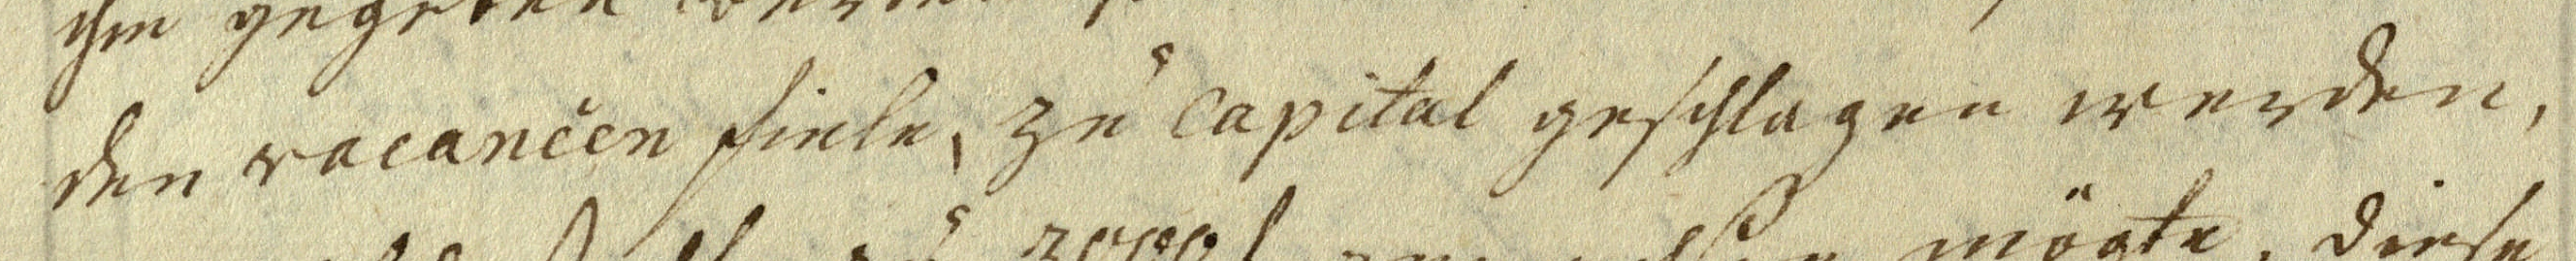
den vacancen fiele, zu capital geschlagen werden,
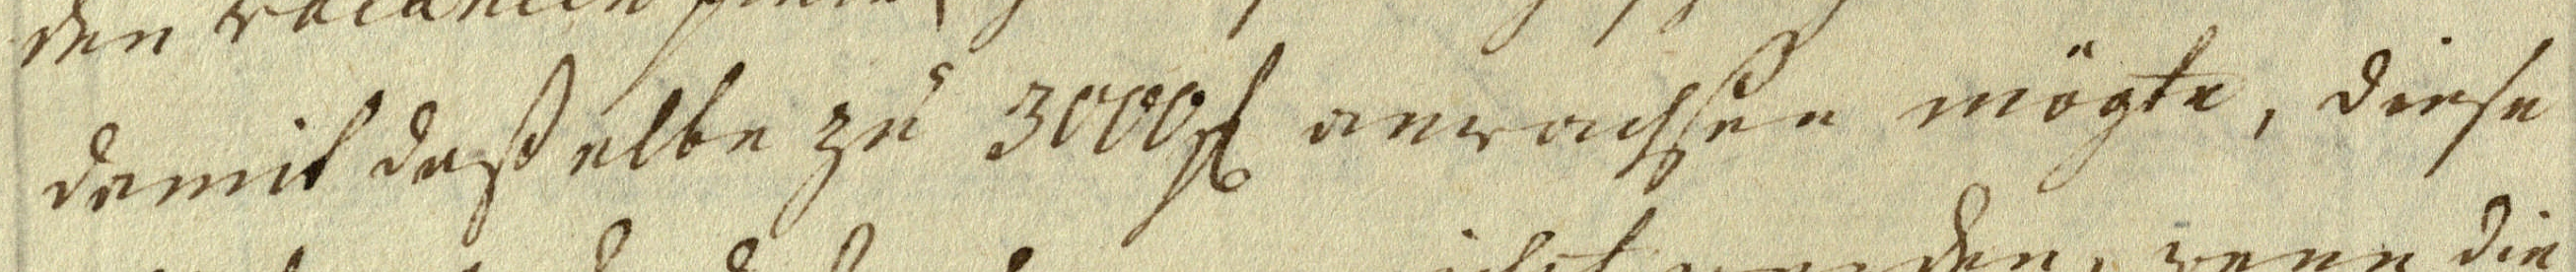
damit daßelbe zu 3000 s anwachsen mögte, diese
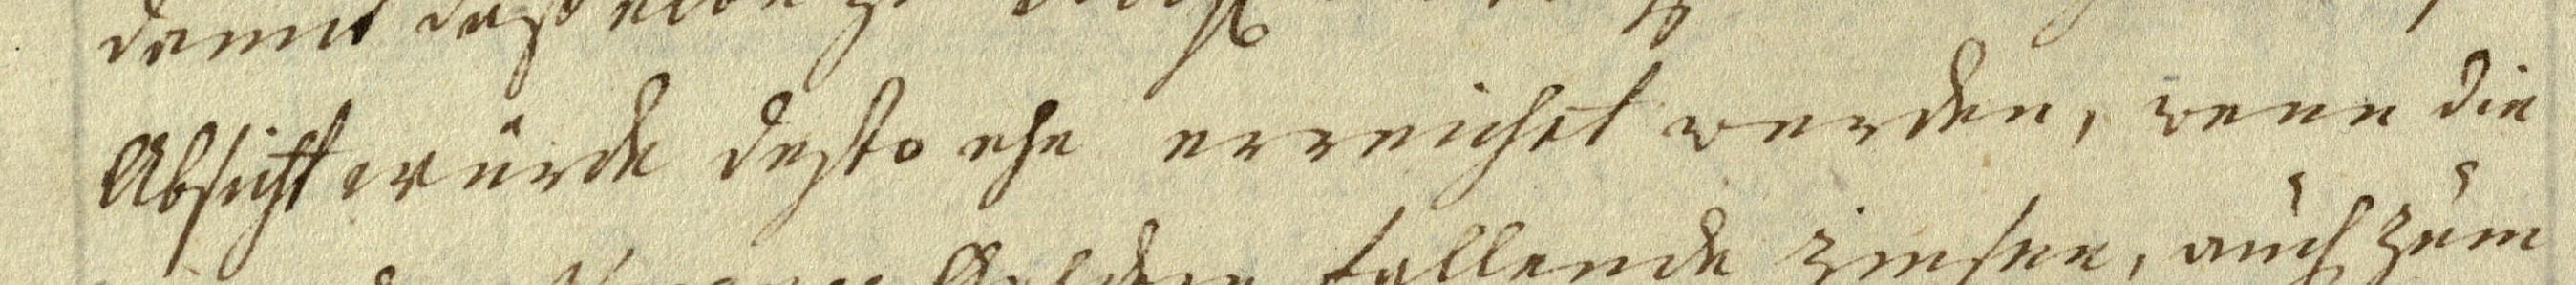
Absicht würde desto ehe erreichet werden, wenn die
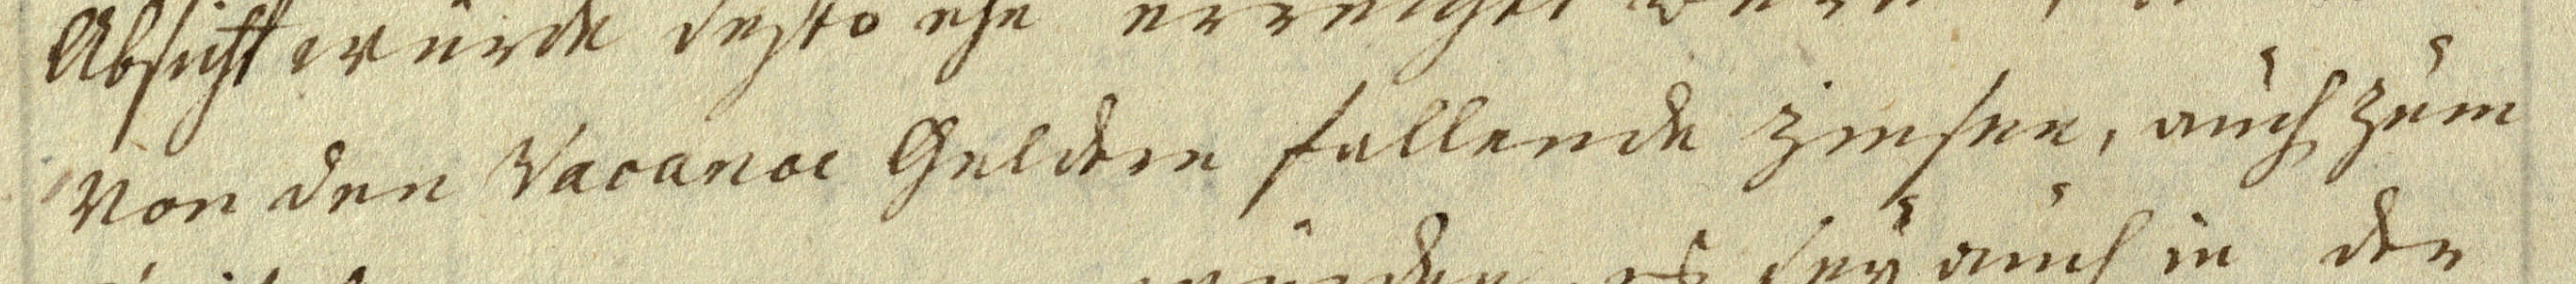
von den Vacance Geldern fallende Zinsen, auch zum
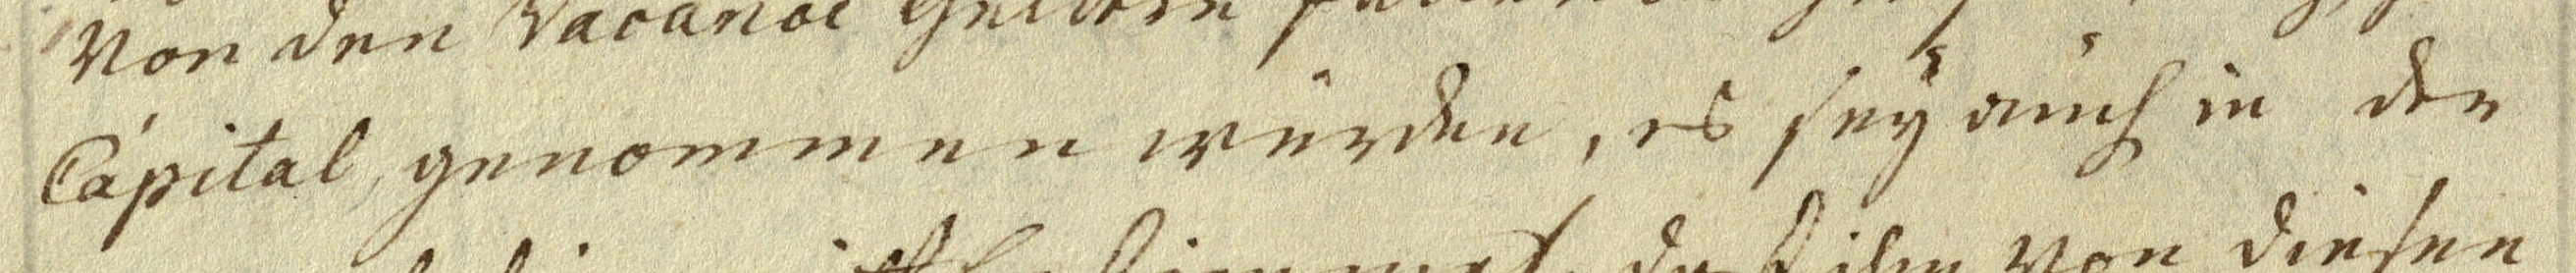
capital genommen würden, es seÿ auch in der
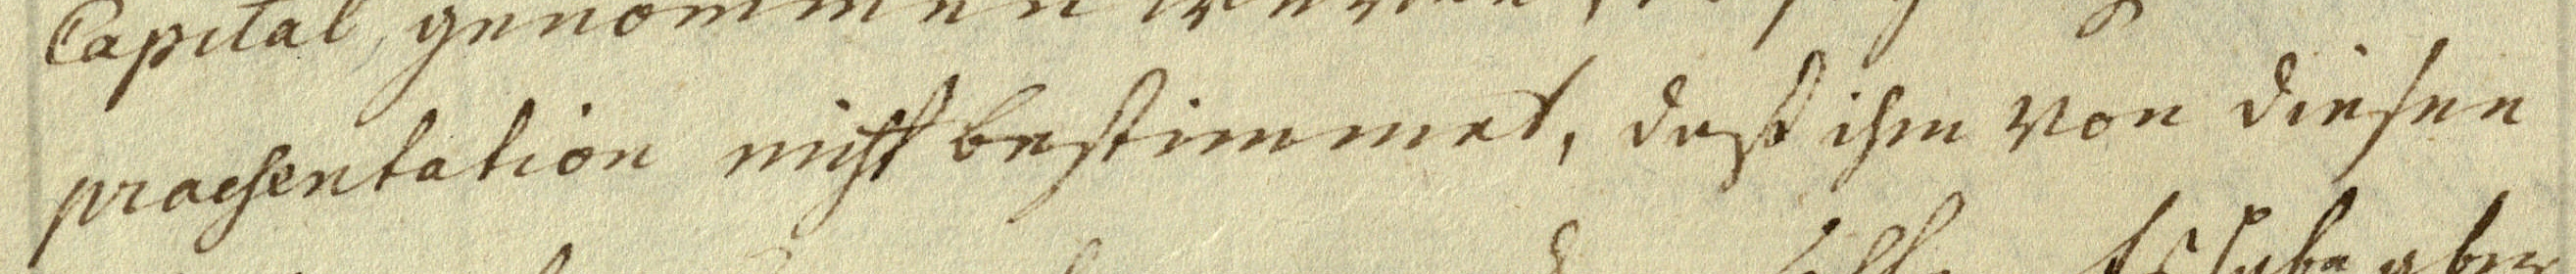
praesentation nicht bestimmet, daß ihm von diesen
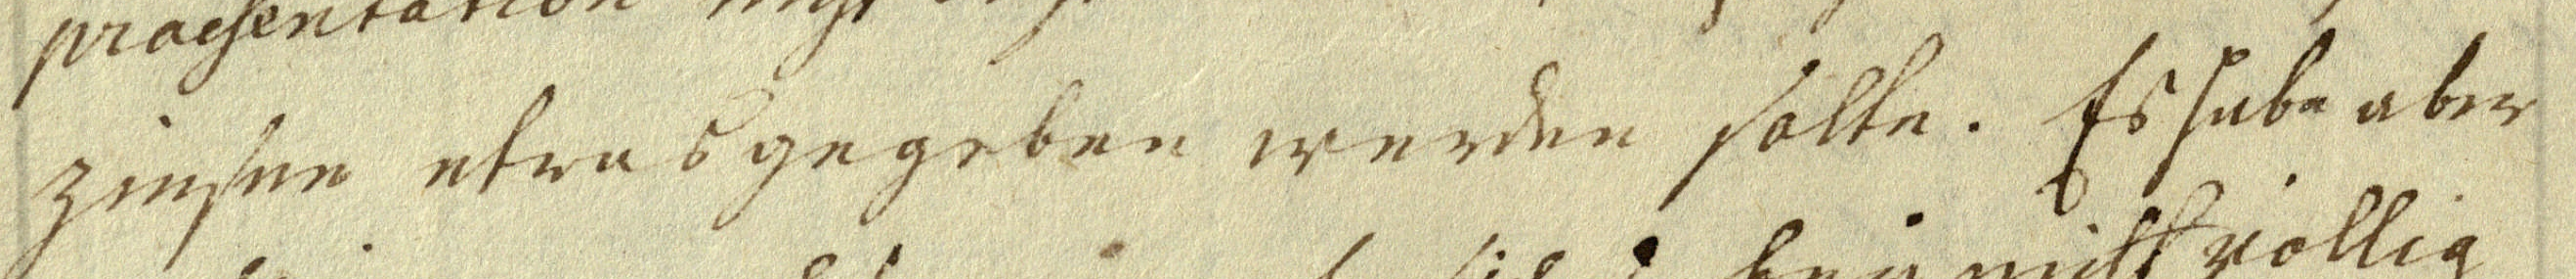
zinsen etwas gegeben werden solte. Es habe aber
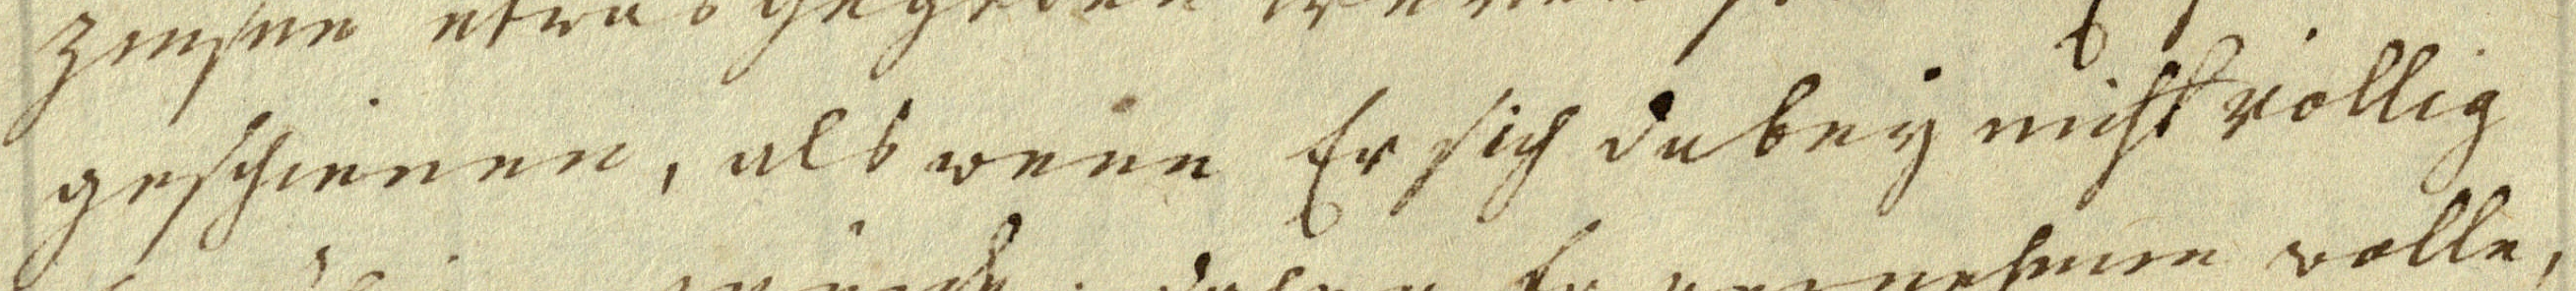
geschienen, als wenn Er sich dabeÿ nicht völlig
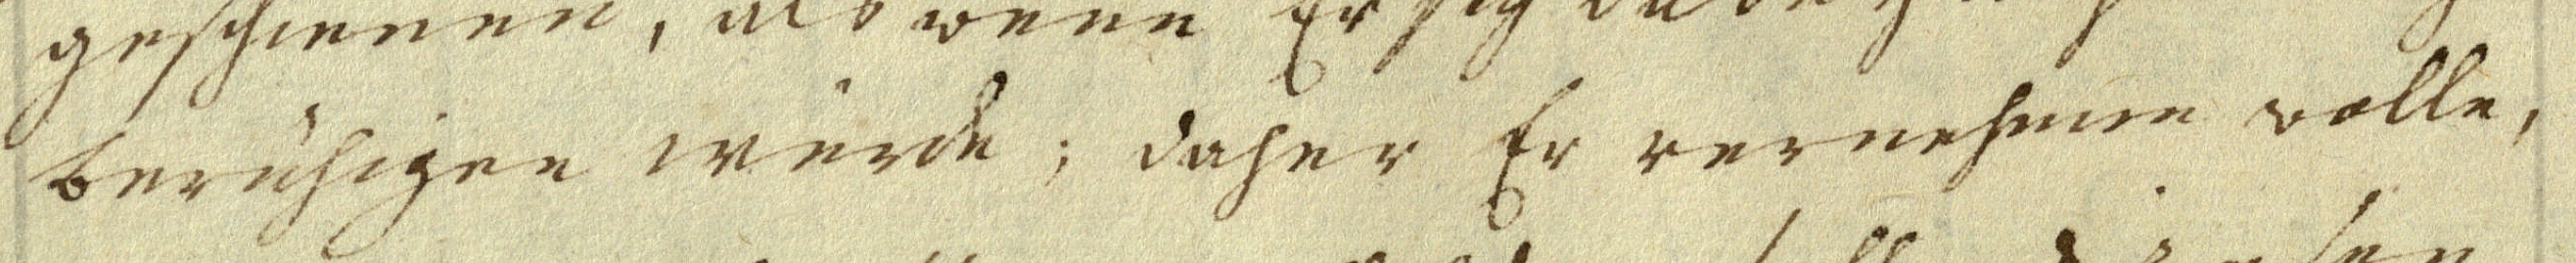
beruhigen würde, daher Er vernehmen wolle,
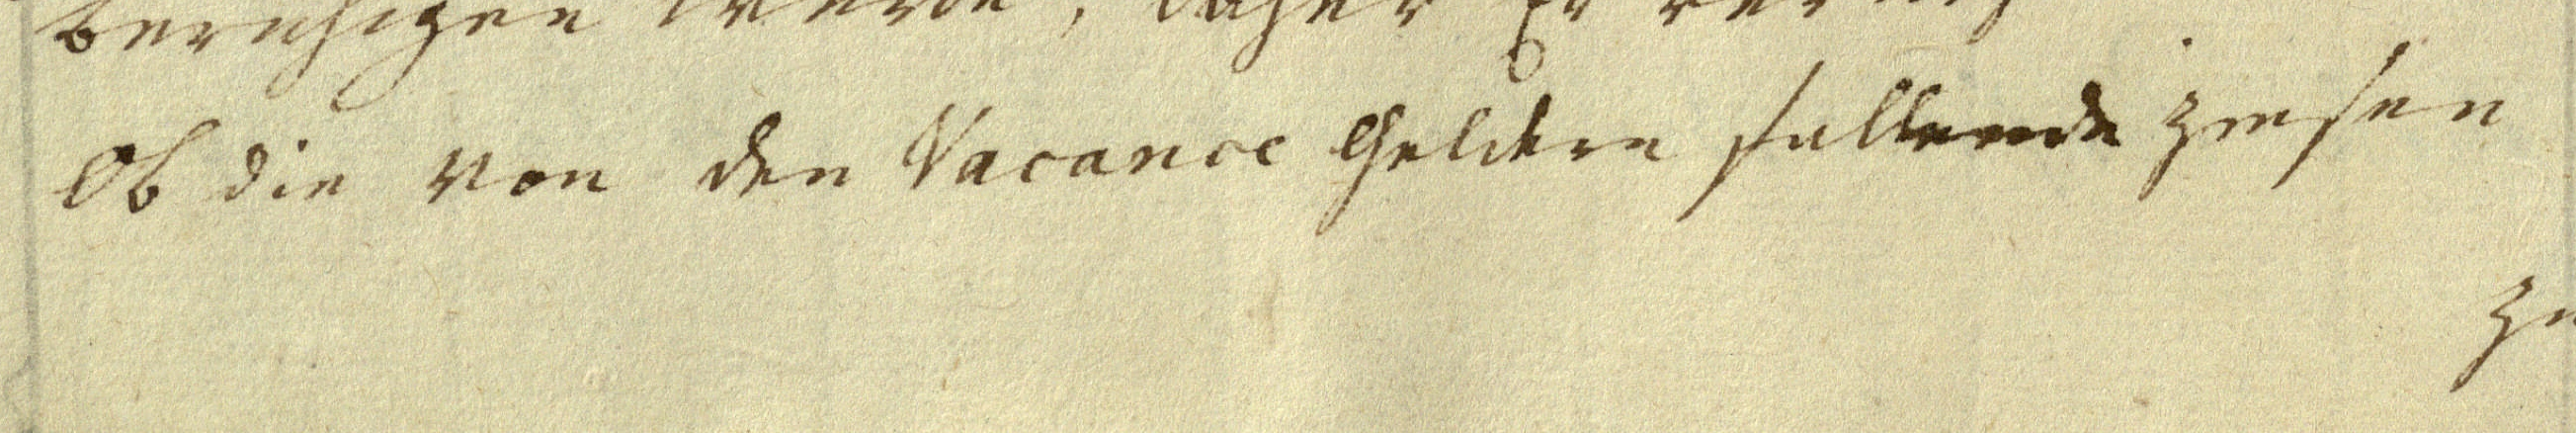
ob die von den Vacance Geldern fallende zinsen
